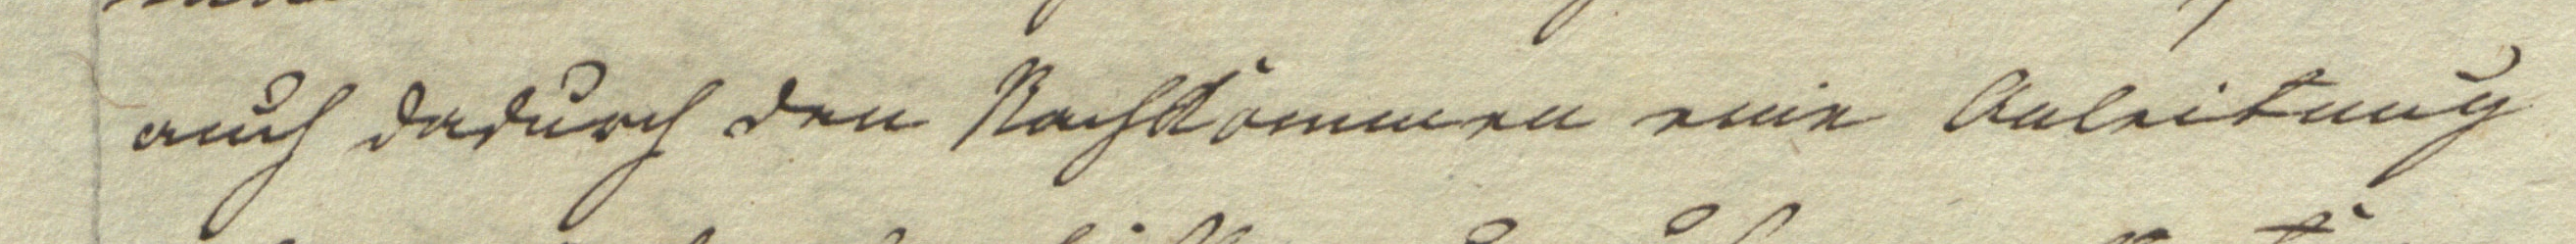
auch dadurch den Nachkommen eine Anleitung
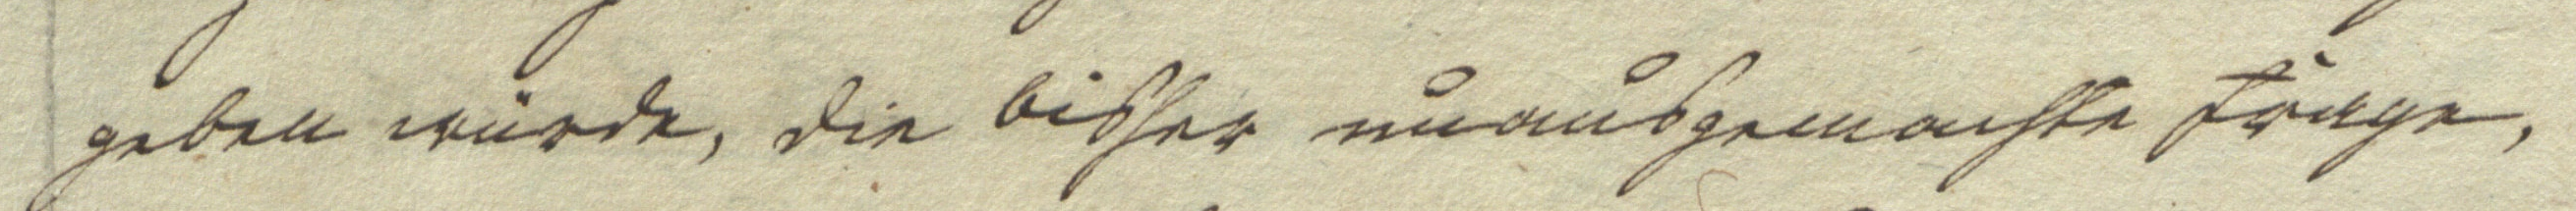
geben würde, die bisher unausgemachte Frage,
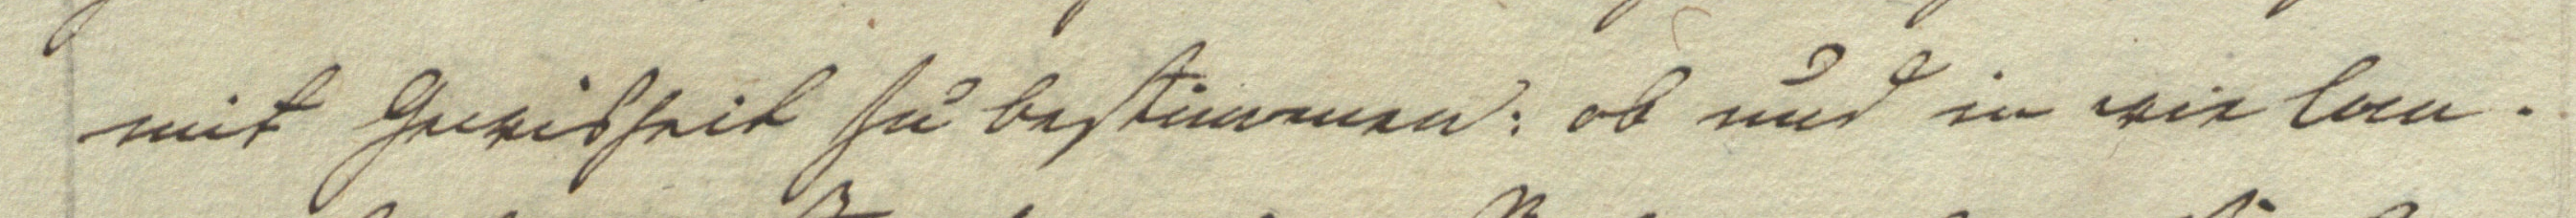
mit Gewisheit zu bestimmen: ob und in wie lan¬
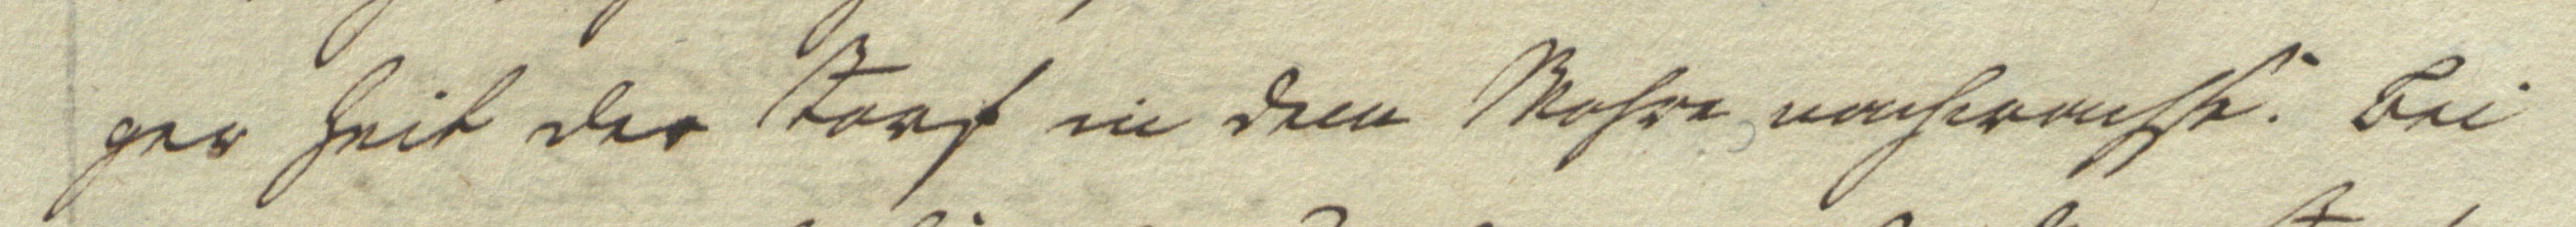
ger Zeit der Torf in dem Mohre nachwachse. Bei
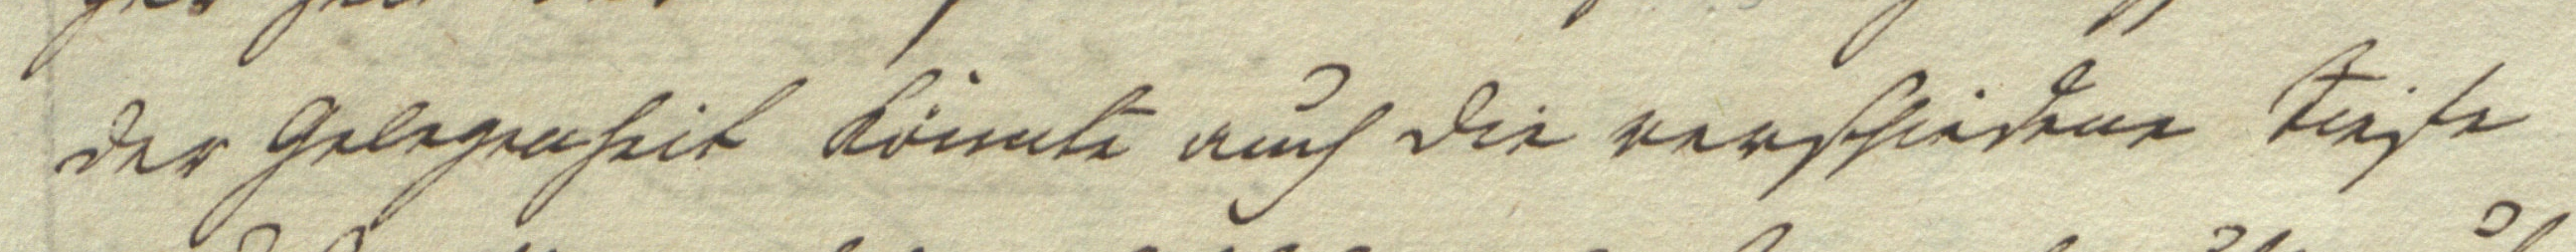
der Gelegenheit könnte auch die verschiedene Reife
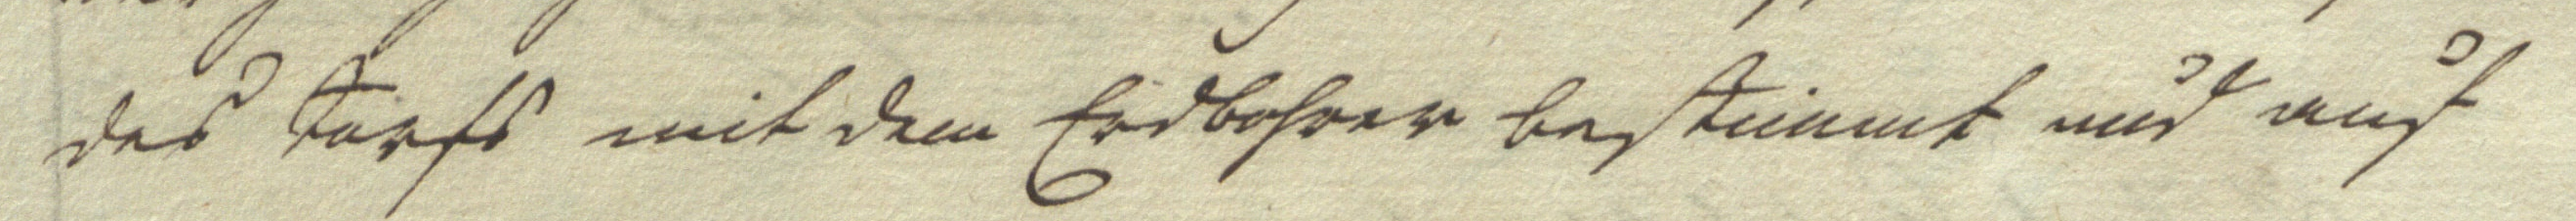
des Torfs mit dem Erdbohrer bestimmt und auf
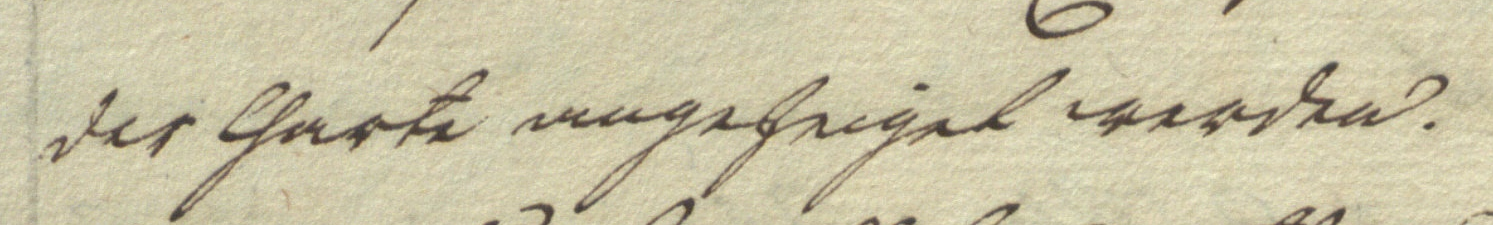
der Charte angezeiget werden.
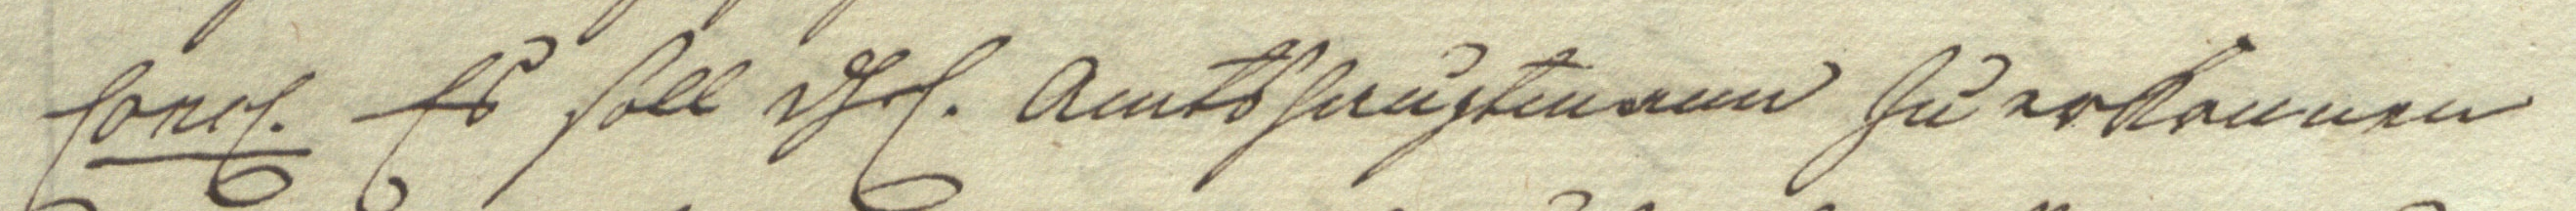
Concl. Es soll dh. Amtshauptmann zu erkennen
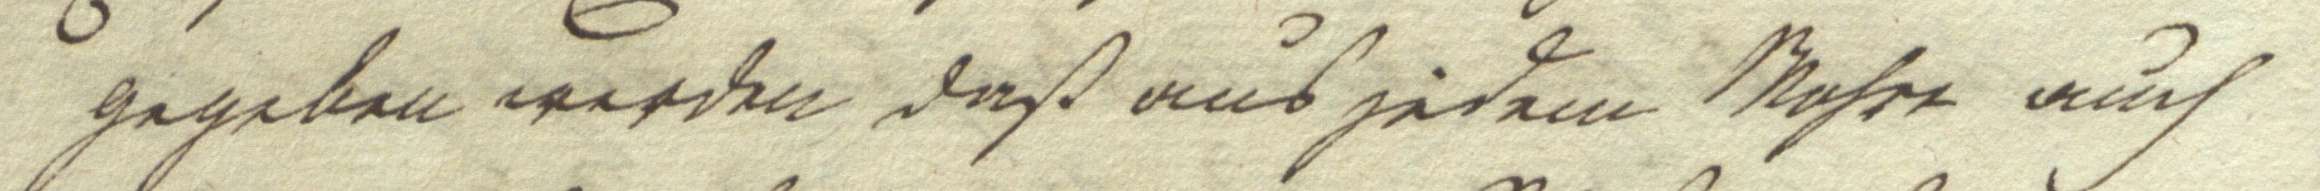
gegeben werden daß aus jedem Mohr auch
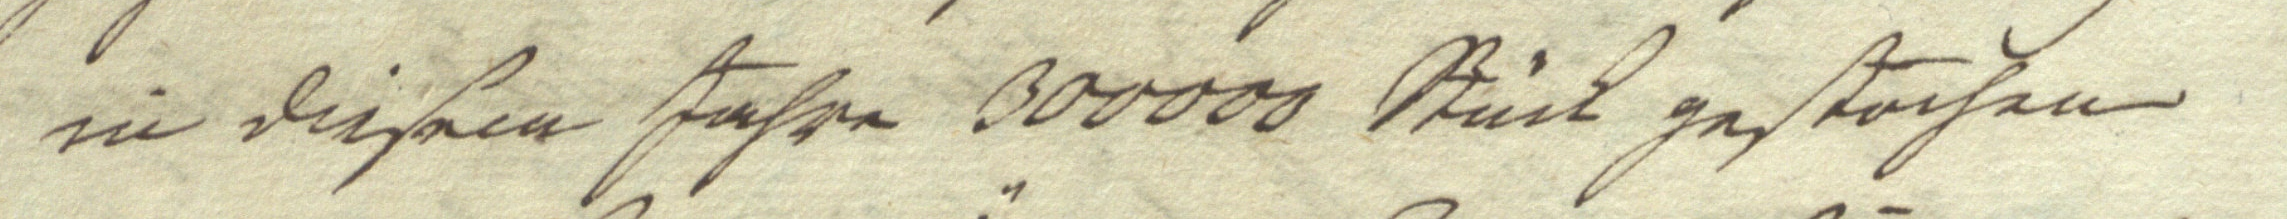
in diesem Jahre 300000 Stück gestochen
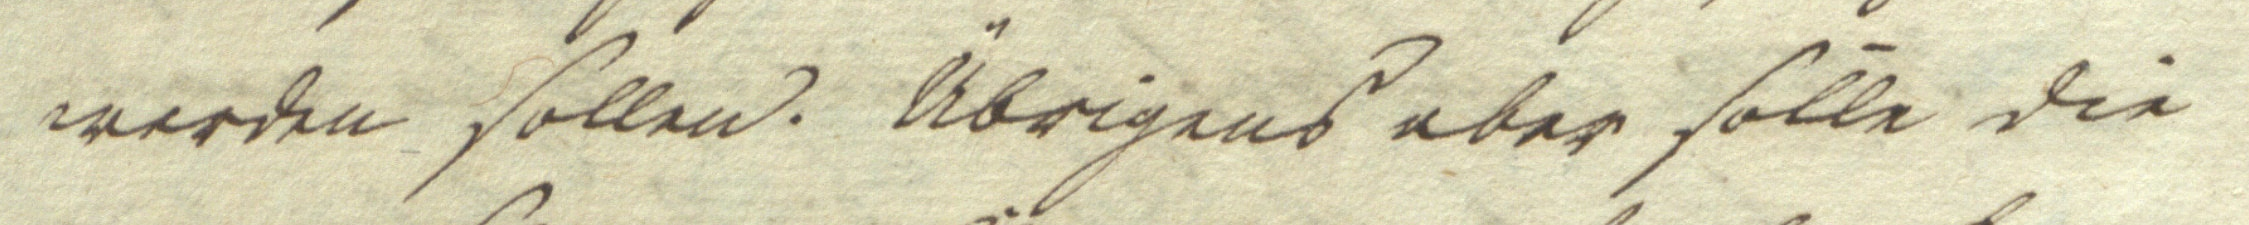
werden sollen. Übrigens aber solle die
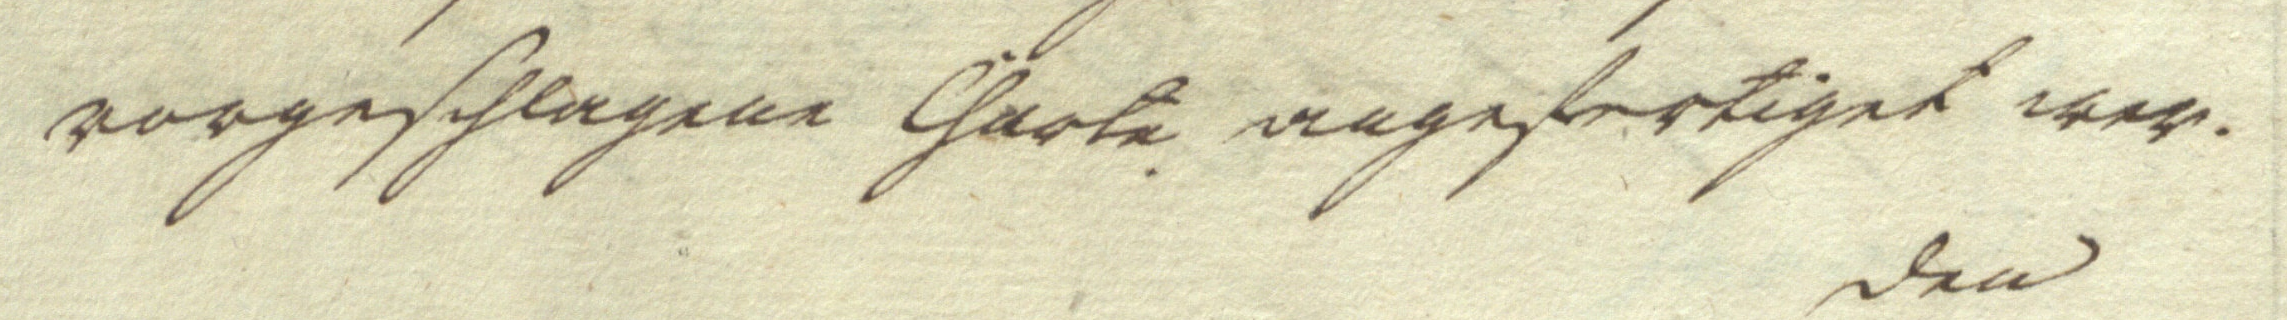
vorgeschlagene Charte angefertiget wer¬
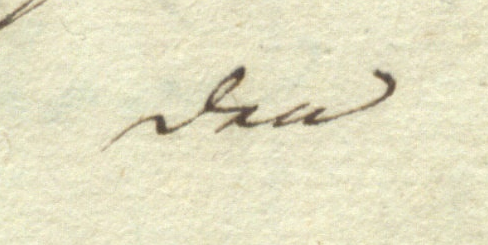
den
